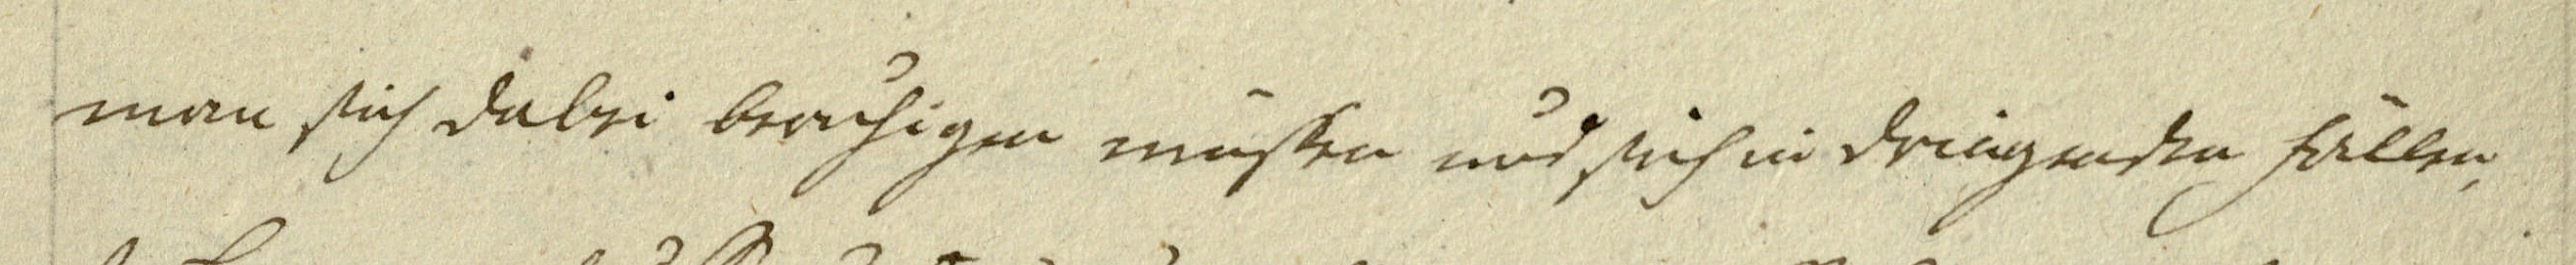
man sich dabei beruhigen müssen und sich in dringenden Fällen
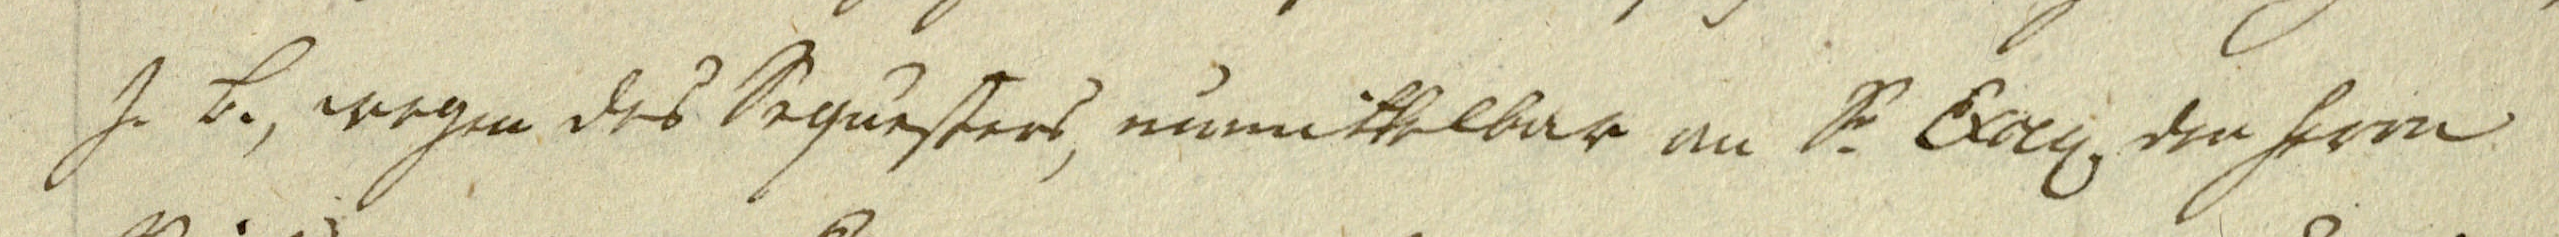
z. B., wegen des Sequesters, unmittelbar an Sr. Excel. den Herrn
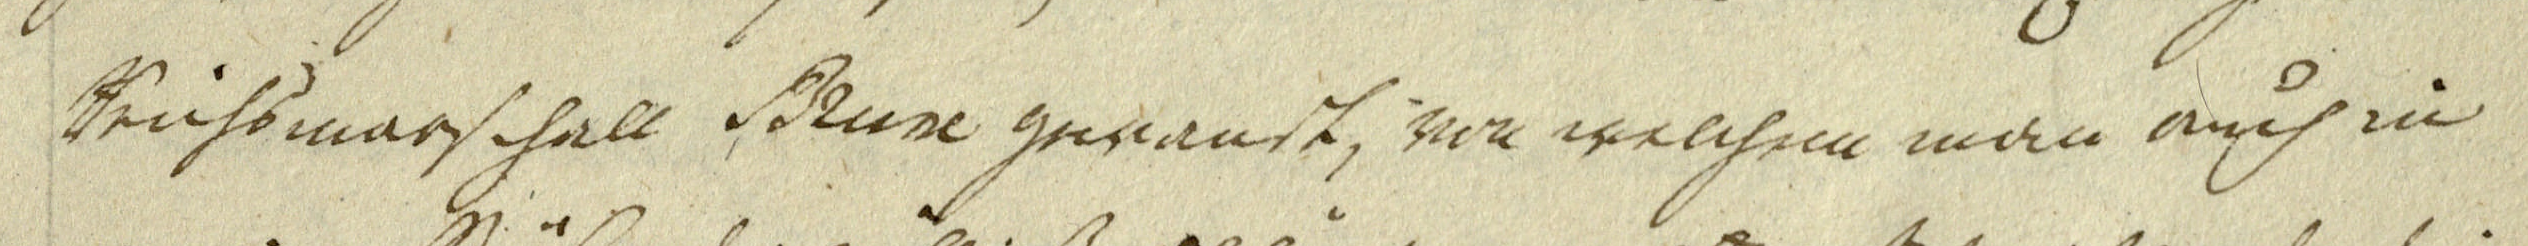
Reichsmarschall Brune gewandt, von welchem man auch in
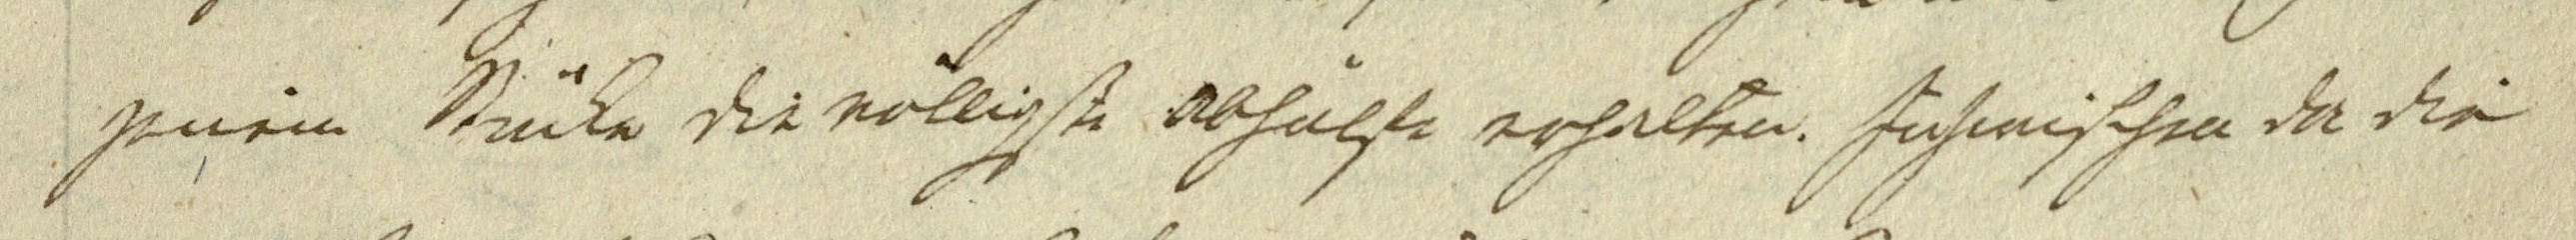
jenem Stücke die völligste Abhülfe erhalten. Inzwischen da die
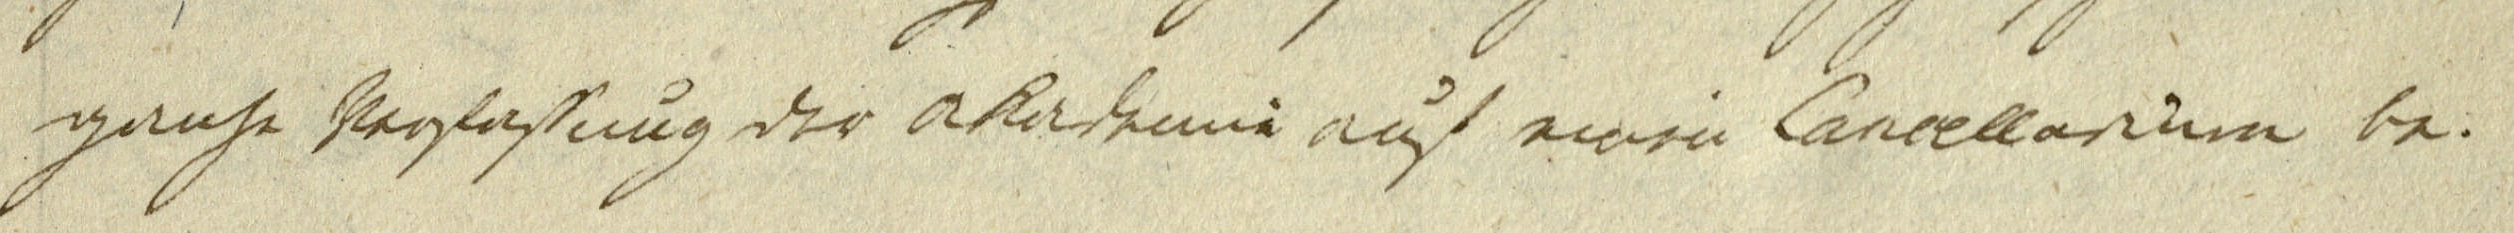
ganze Verfassung der Akademie auf einen Cancellarium be¬
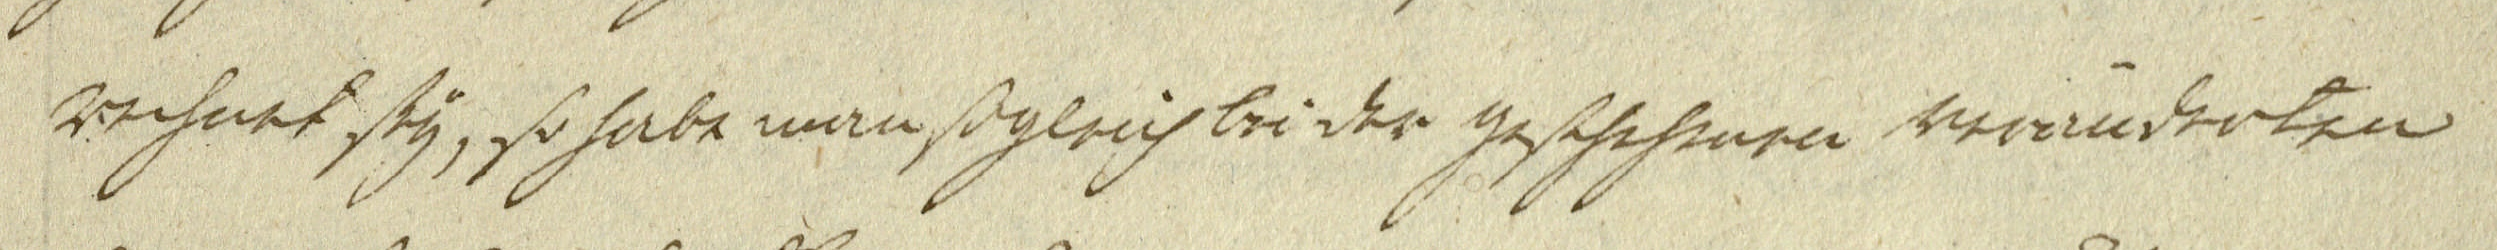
rechnet seÿ, so habe man sogleich bei der geschehenen veränderten
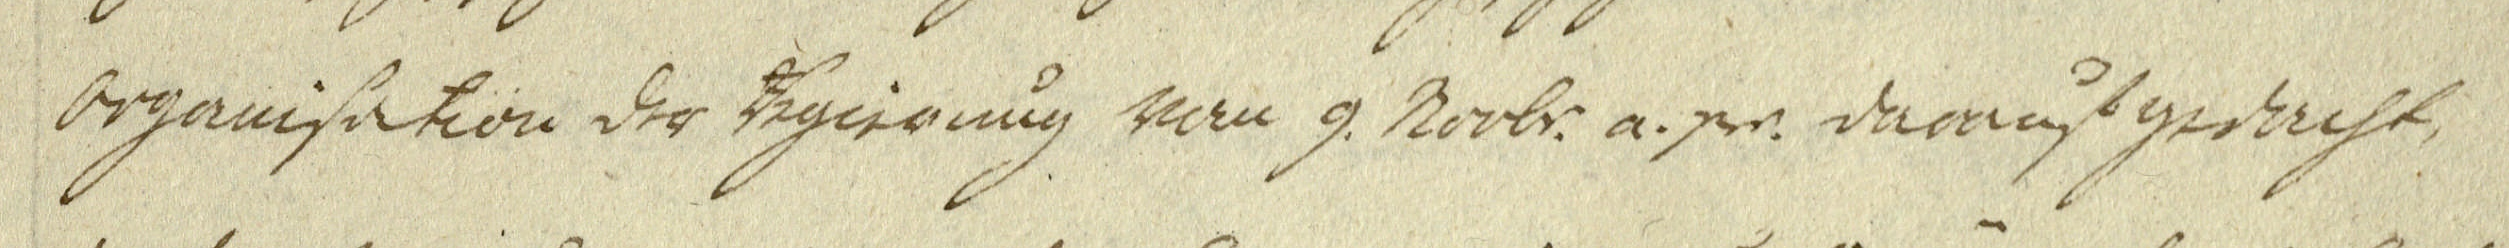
Organisation der Regierung vom 9. Novbr. a. pr. darauf gedacht,
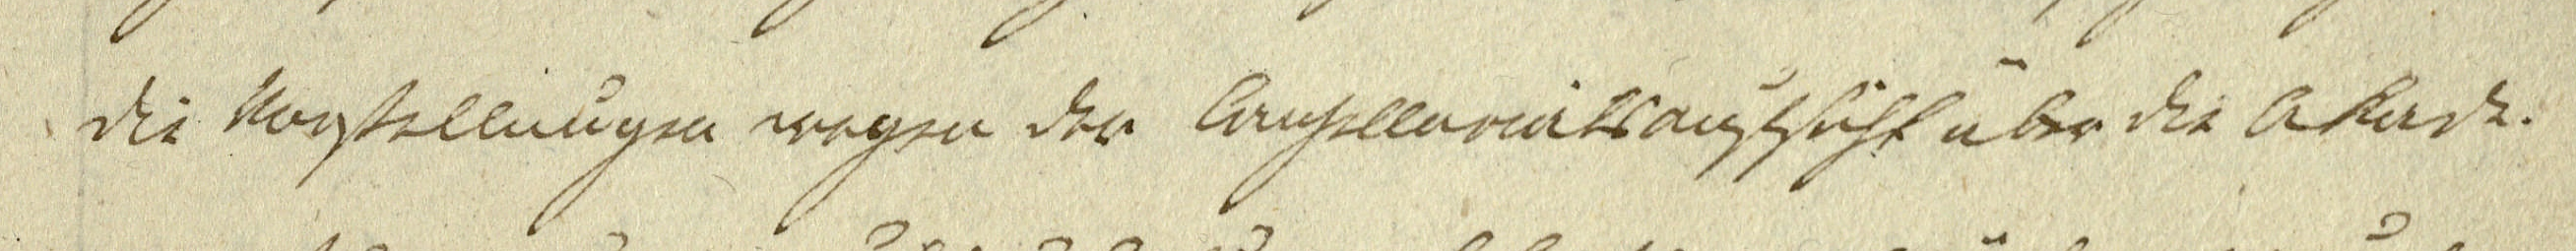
die Vorstellungen wegen der Canzellariatsaufsicht über die Akade¬
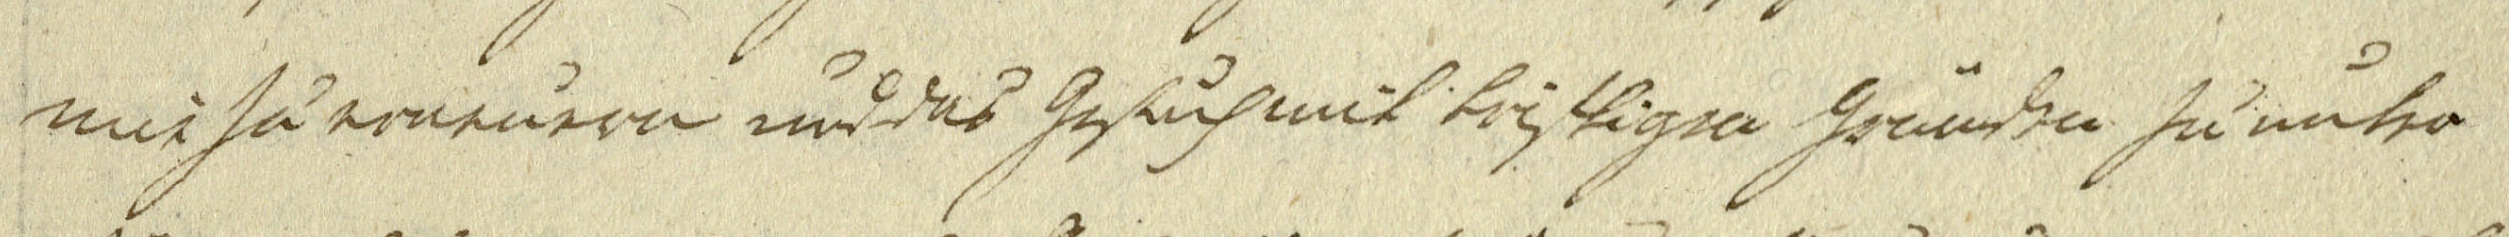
mie zu erneuern und das Gesuch mit triftigen Gründen zu unter¬
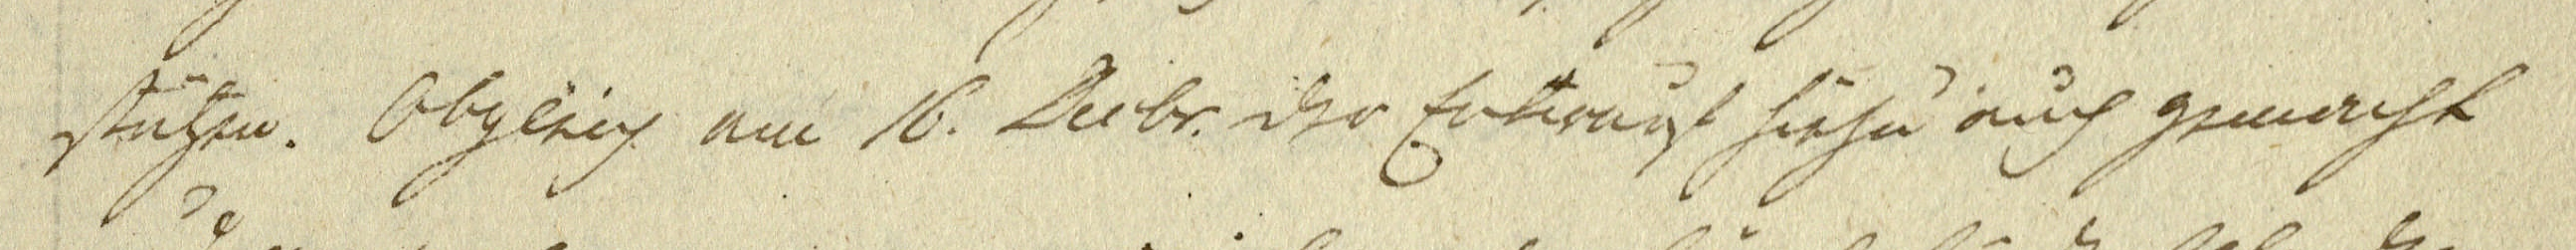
stützen. Obgleich am 16. Decbr. der Entwurf hiezu auch gemacht
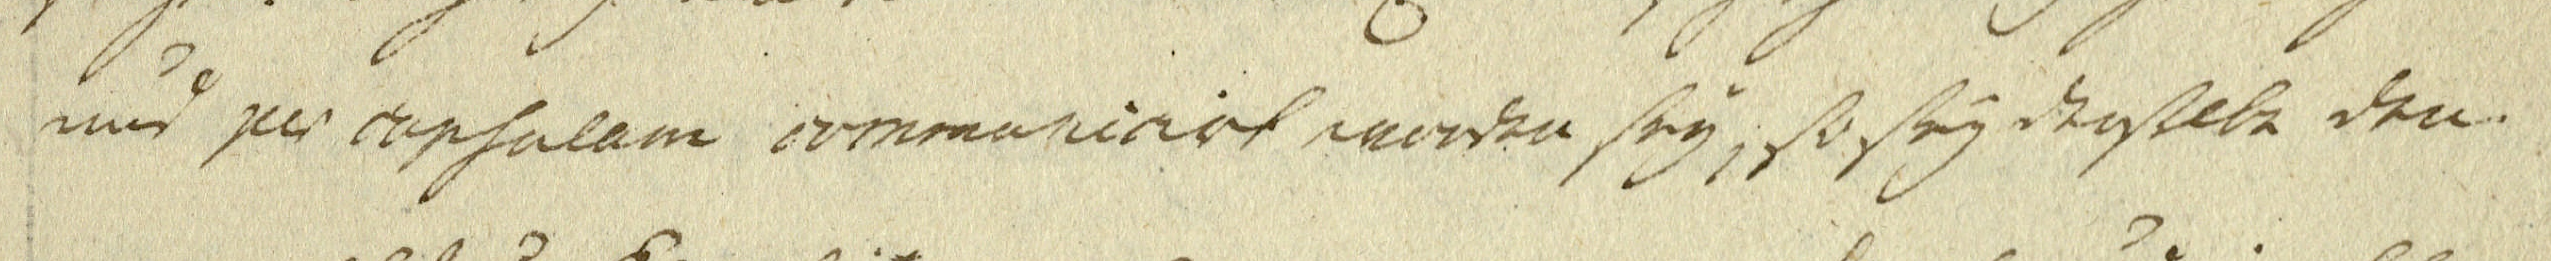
und per capsulam communicirt worden seÿ, so seÿ derselbe den¬
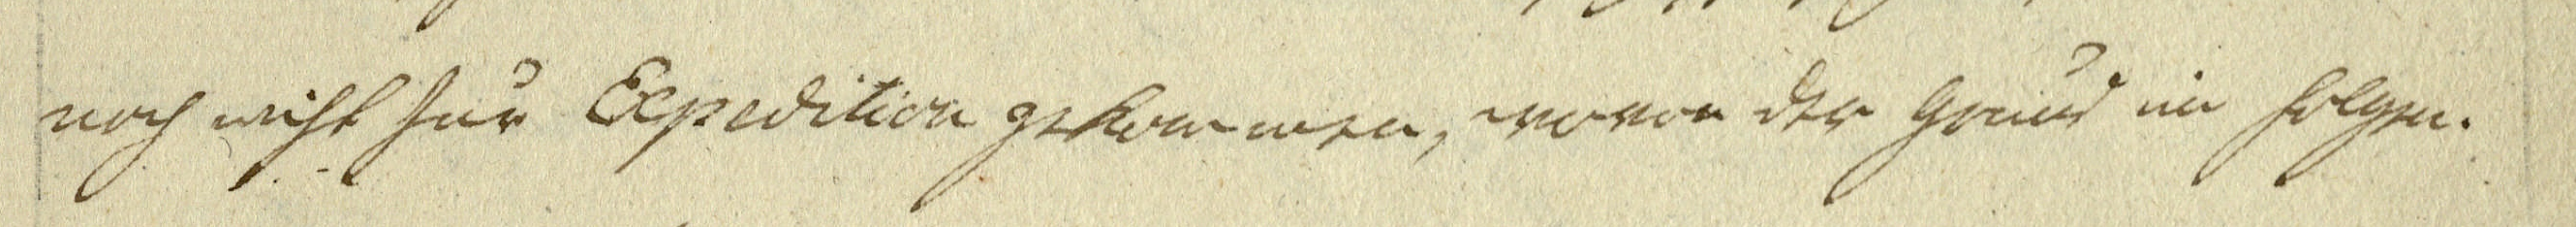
noch nicht zur Expedition gekommen, wovon der Grund im folgen¬
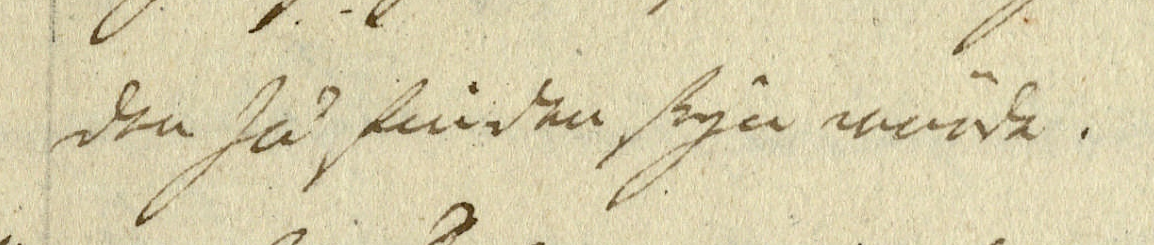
den zu finden seÿn würde.
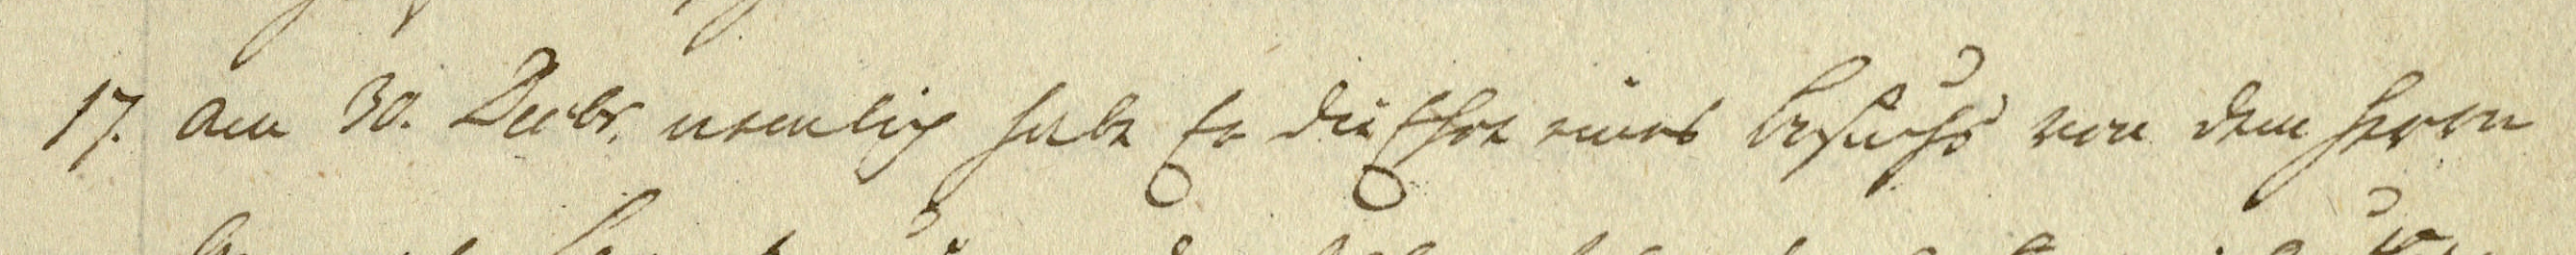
17. Am 30. Decbr. nemlich habe Er die Ehre eines Besuchs von dem Herrn
